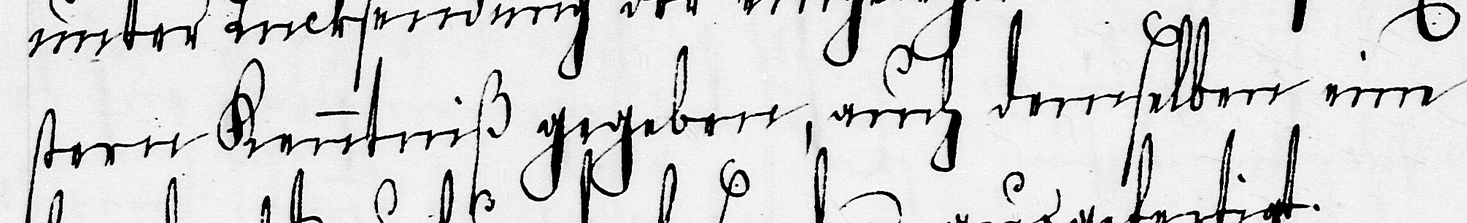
stern Kenntniß gegeben, auch demselben eine
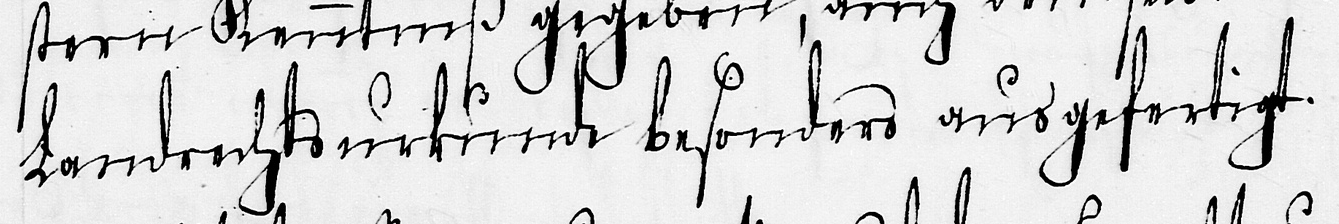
Landrechtsurkunde besonders ausgefertig¬
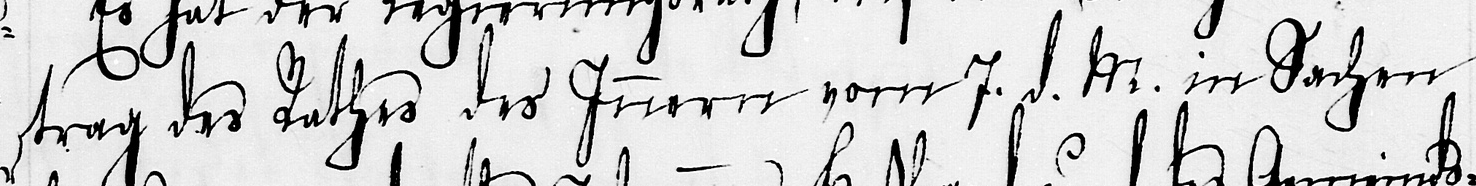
trag des Rathes des Innern vom 7. d. M. in Sachen
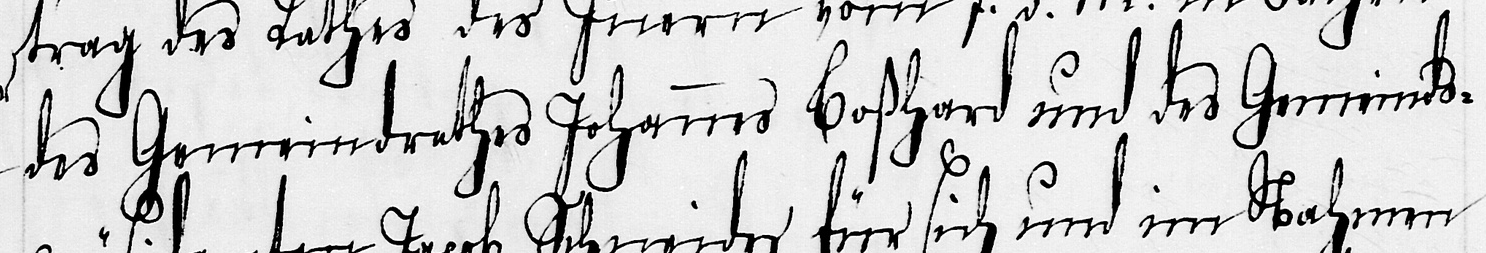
des Gemeindrathes Johannes Boßhard und des Gemeinds¬
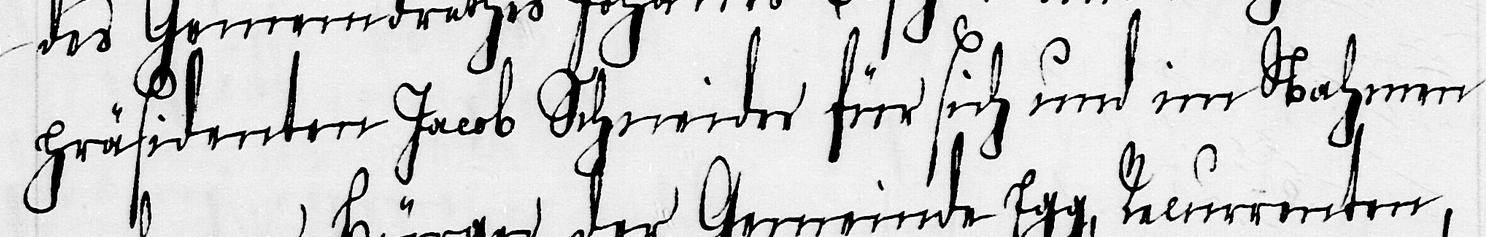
präsidenten Jacob Schneider für sich und im Nahmen
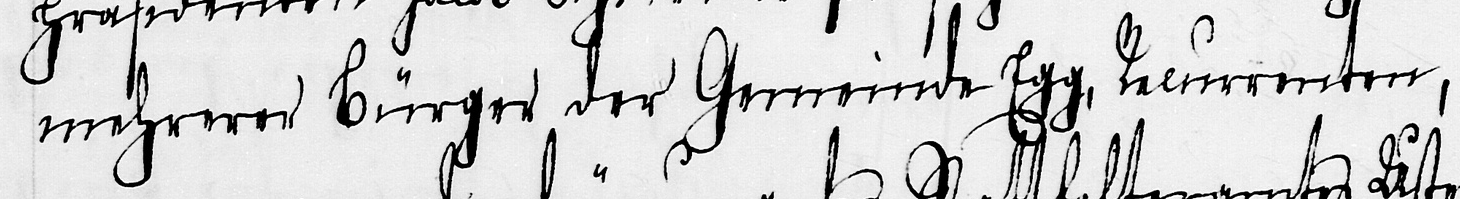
mehrerer Bürger der Gemeinde Egg, Recurrenten,
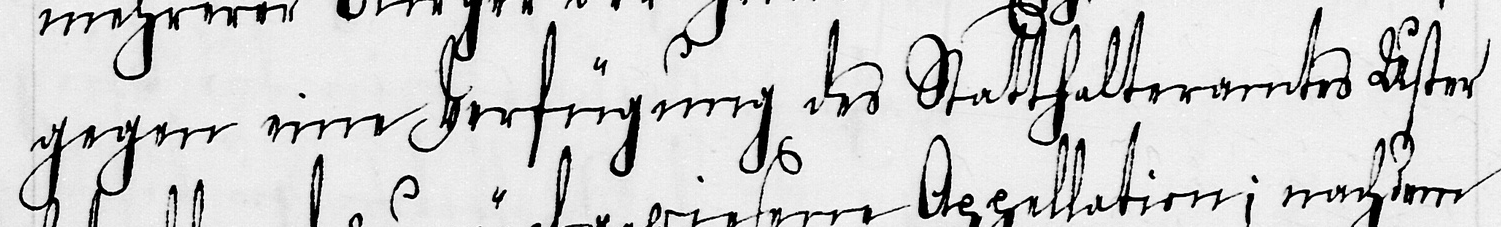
gegen eine Verfügung des Statthalteramtes Uster
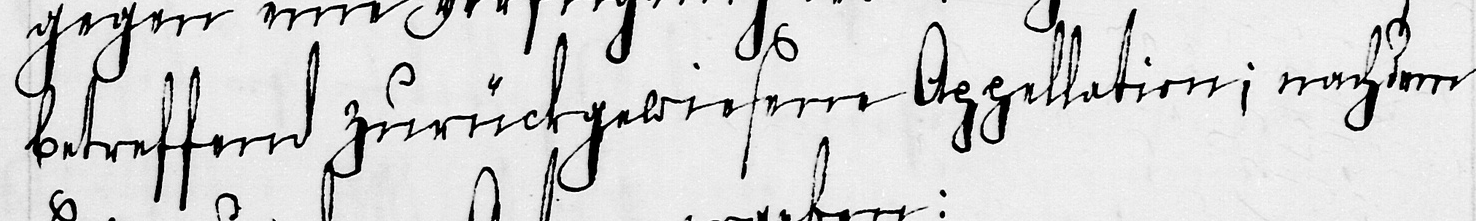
betreffend zurückgewiesene Appellation; nachdem
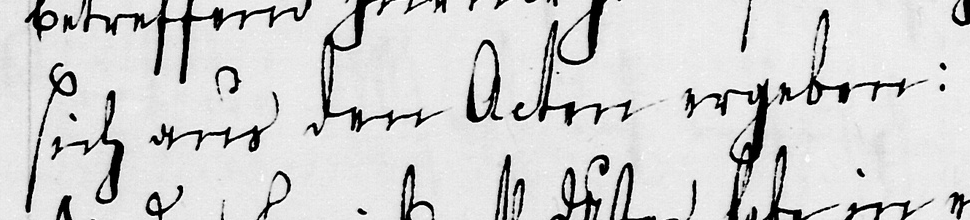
sich aus den Acten ergeben:
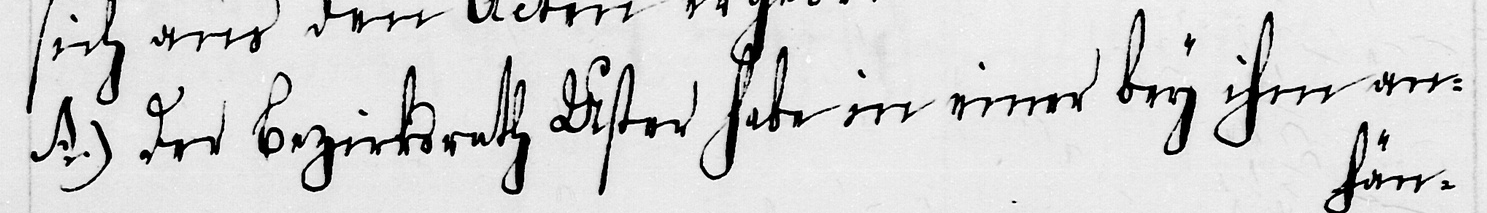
A.) Der Bezirksrath Uster habe in einer bey ihm an-
